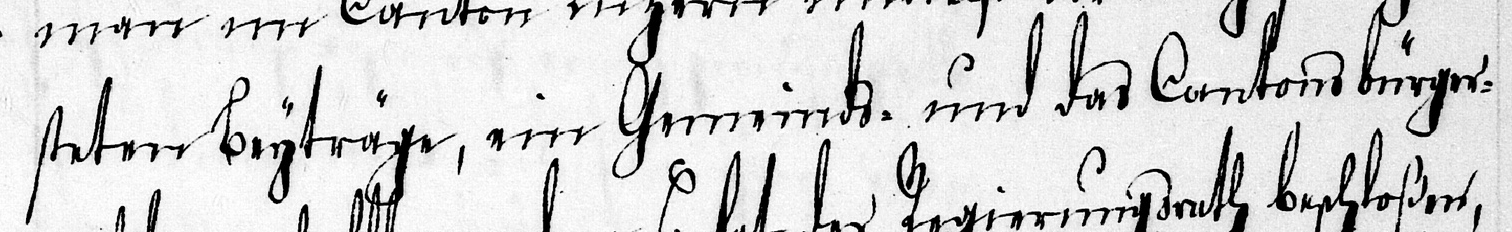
steten Beyträge, ein Gemeinds- und das Cantonsbürger¬
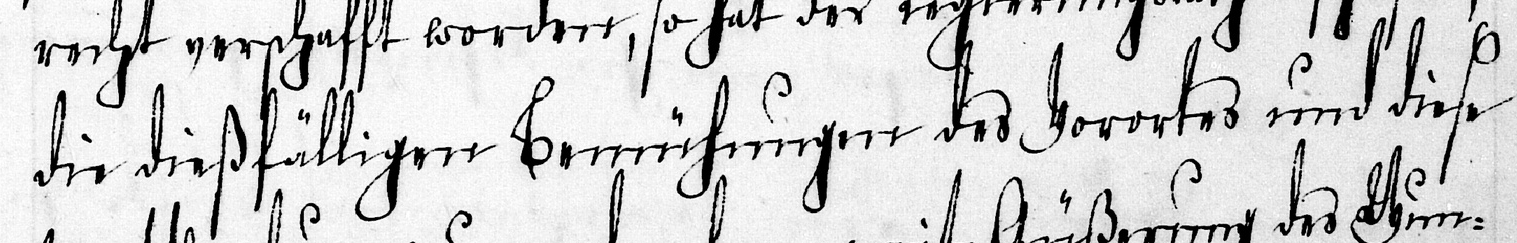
die dießfälligen Bemühungen des Vorortes und diese
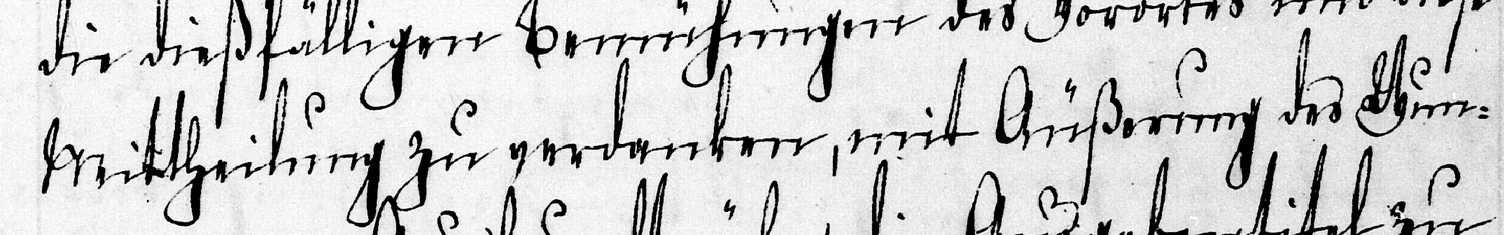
Mittheilung zu verdanken, mit Äußerung des Wun¬
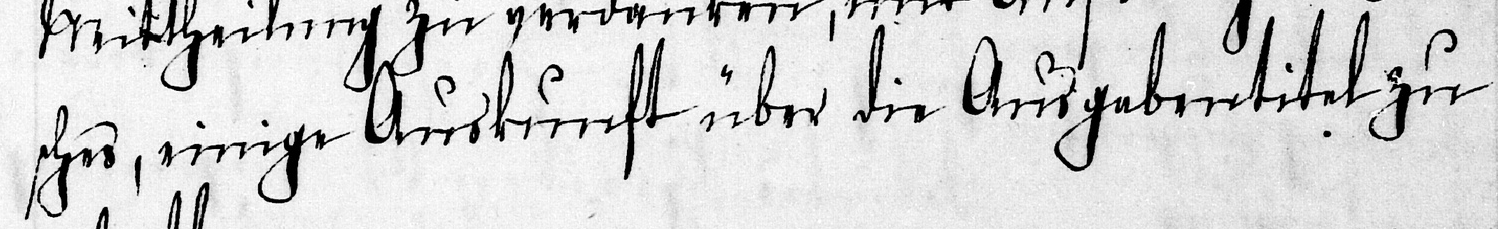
sches, einige Auskunft über die Ausgabentitel zu
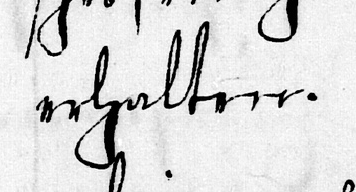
erhalten.
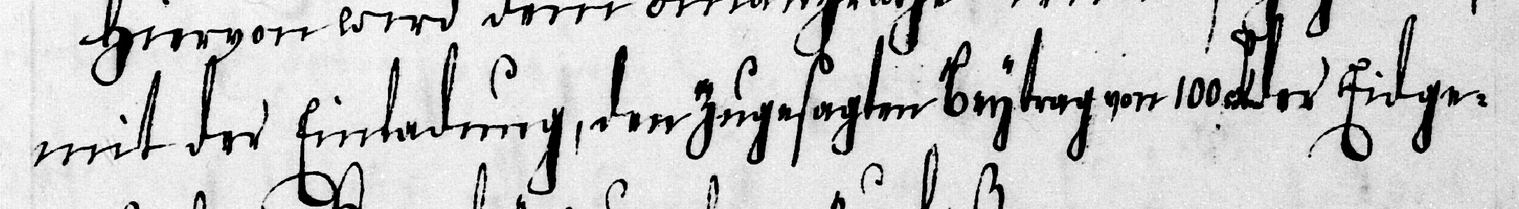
mit der Einladung, den zugesagten Beytrag von 100. Frk[e¬
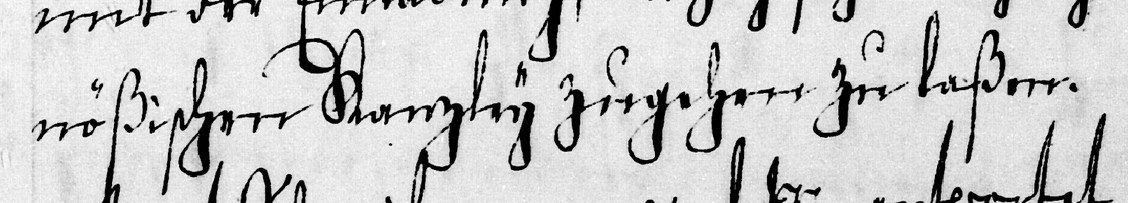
nößischen Kanzley zugehen zu laßen.
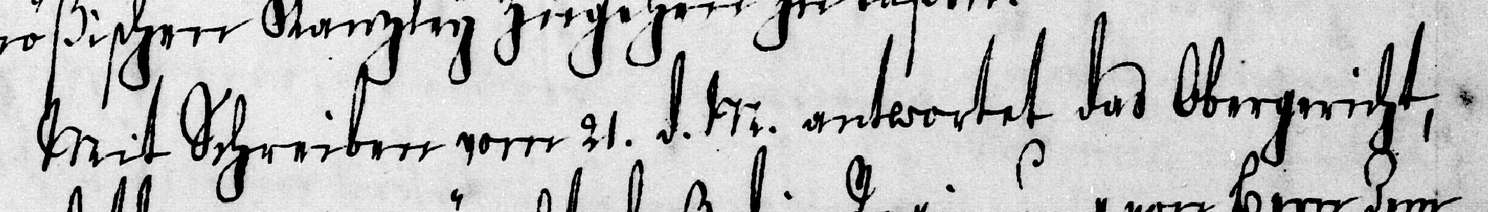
Mit Schreiben vom 21. d. M. antwortet das Obergericht,
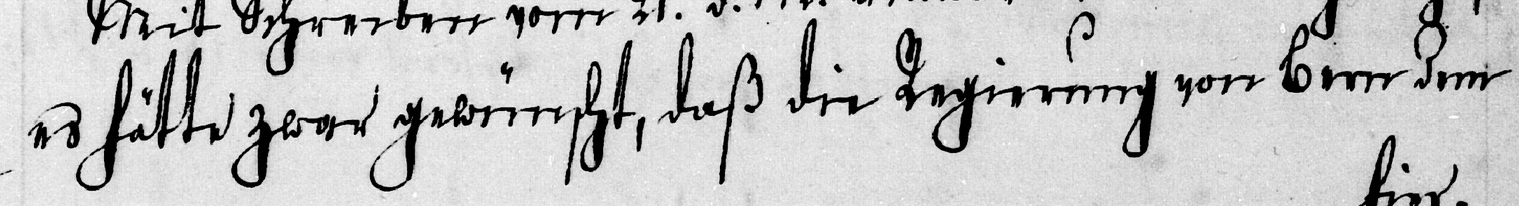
es hätte zwar gewünscht, daß die Regierung von Bern dem
